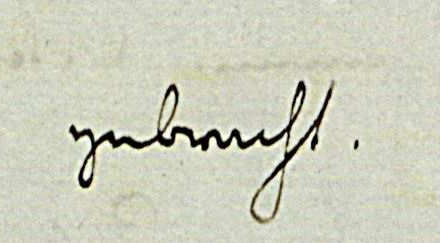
gebracht.
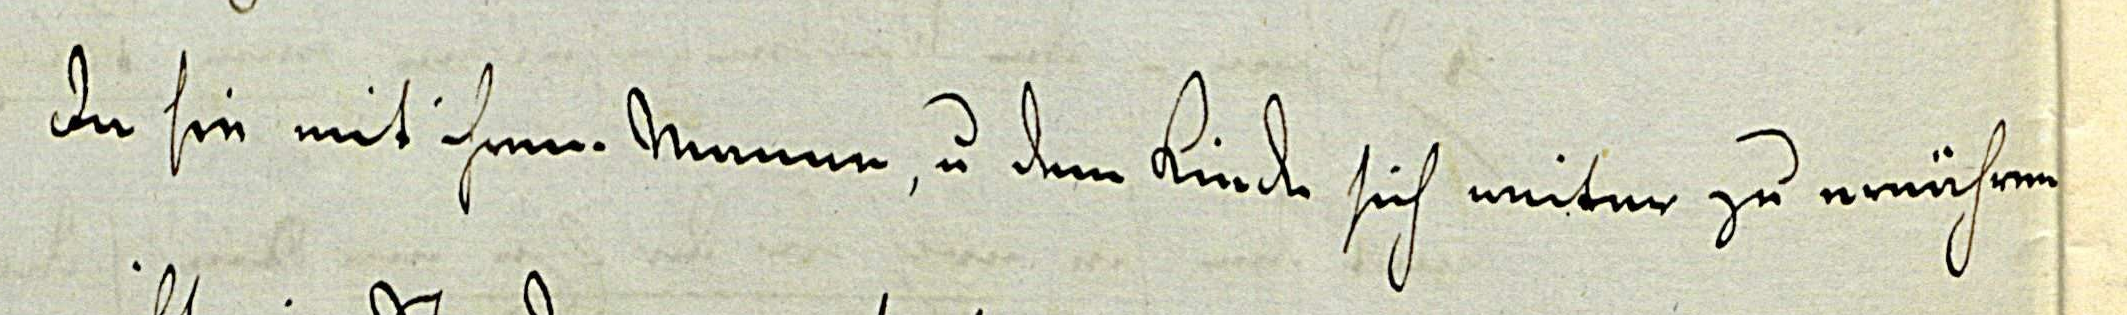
Da sie mit ihren Manne, u dem Kinde sich weiter zu ernähren
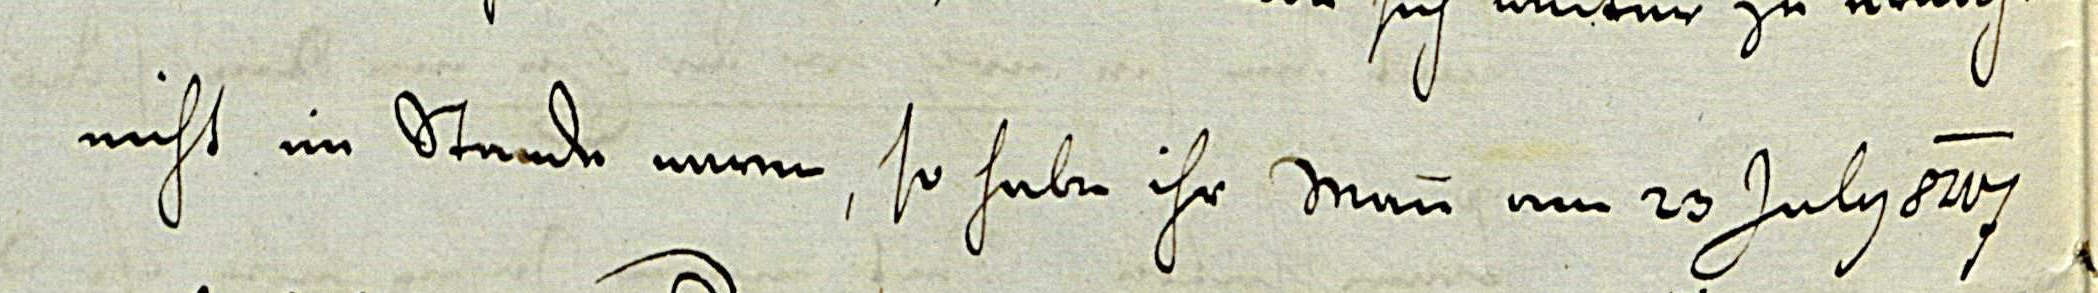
nicht in Stande waren, so habe ihr Mann am 23 Jul 847
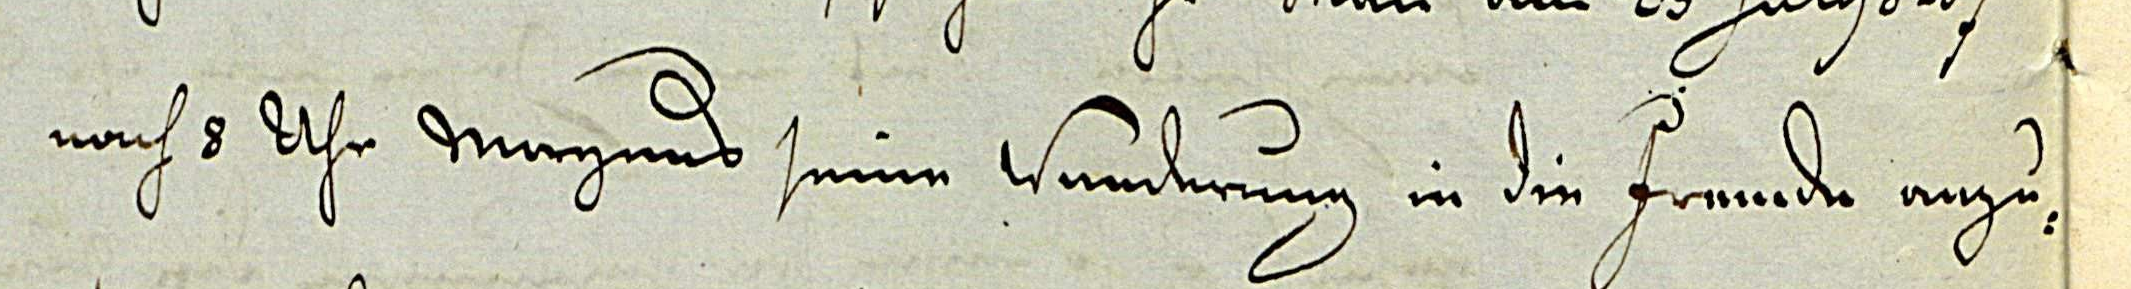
nach 8 Uhr Morgens seine Wanderung in die Fremde anzu¬
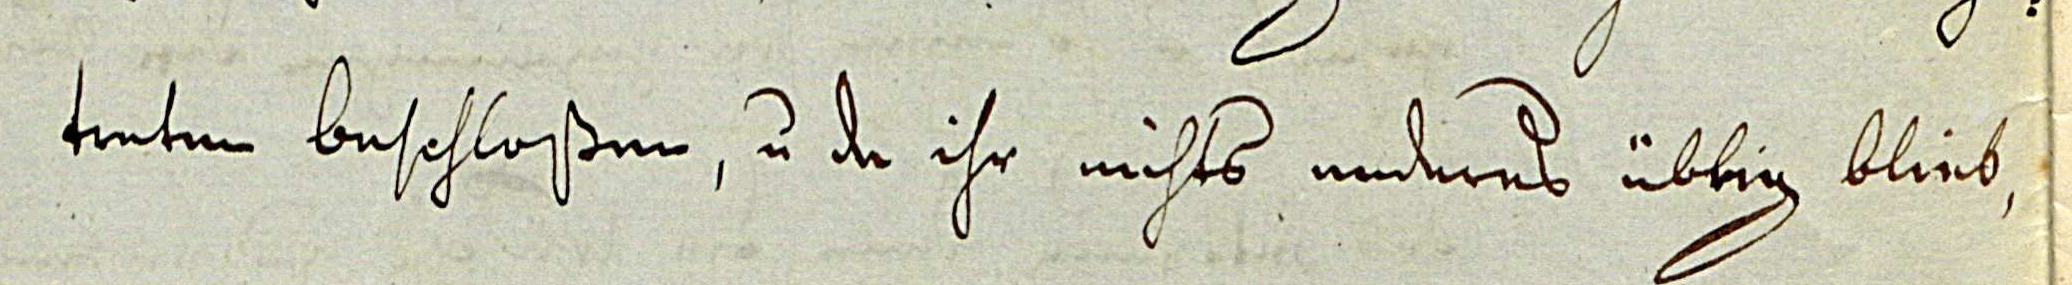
treten beschloßen, u da ihr nichts anders übrig blieb,
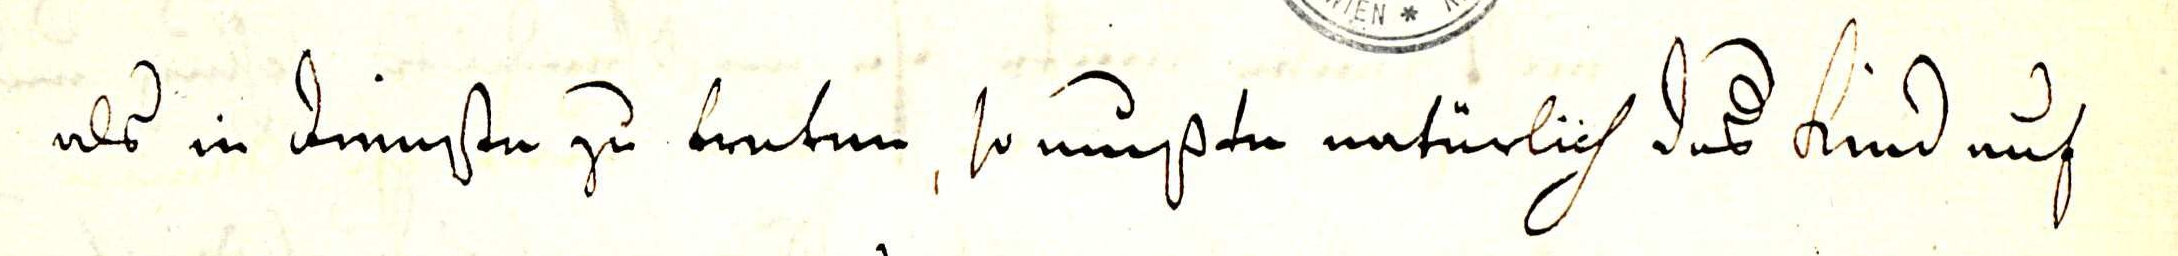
als in Dienste zu treten, so mußte natürlich das Kind auf
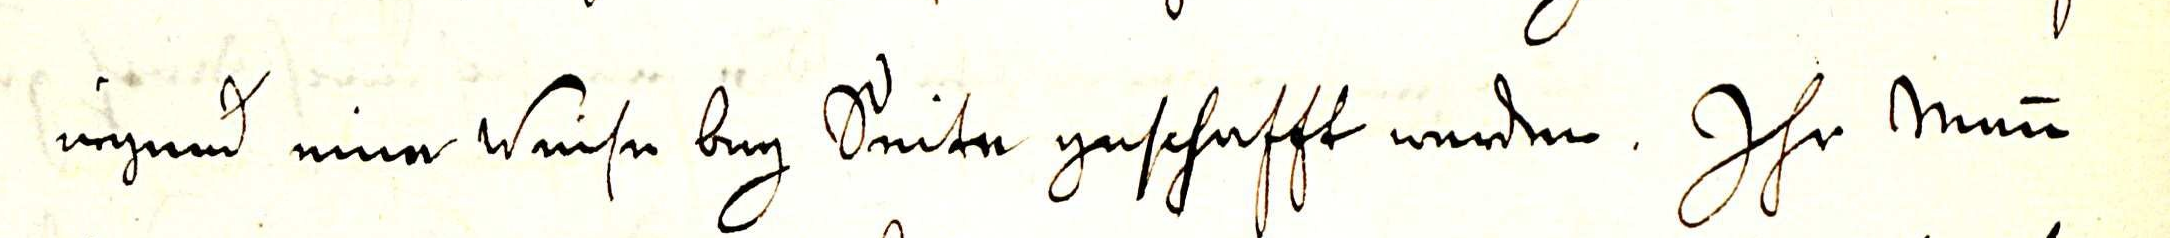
irgend eine Weise bey Seite geschafft werde. Ihr Mann
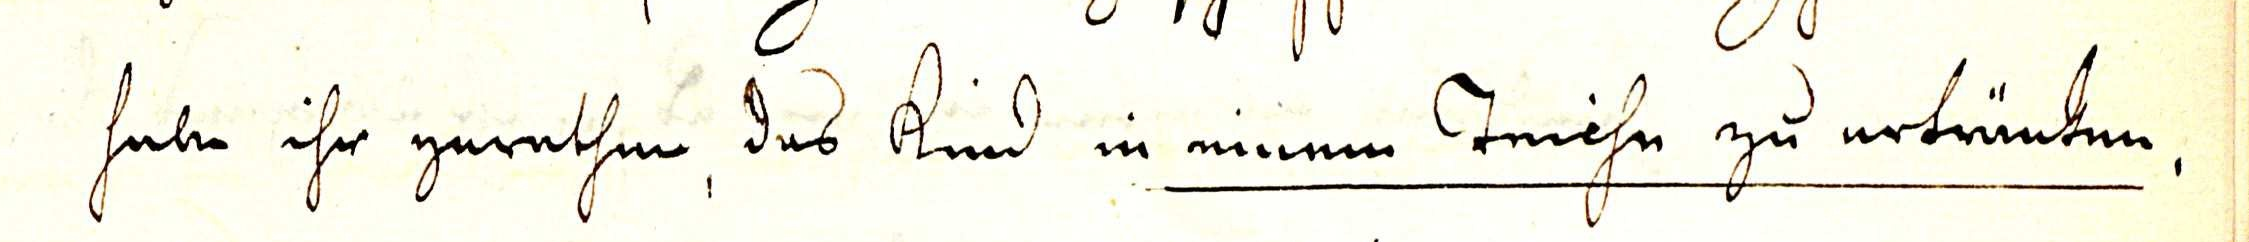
habe ihr gerathen, das Kind in einem Teiche zu ertränken,
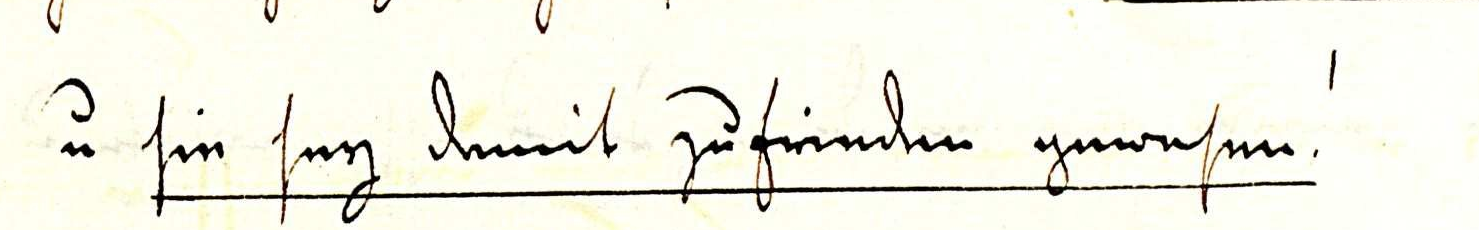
u sie sey damit zufrieden gewesen!
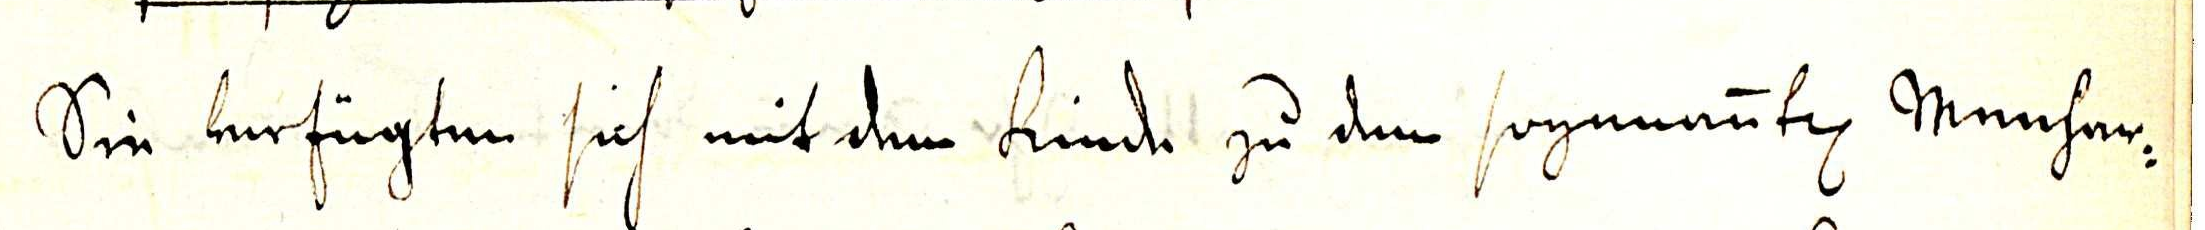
Sie verfügten sich mit dem Kinde zu dem sogenannte Meehar¬
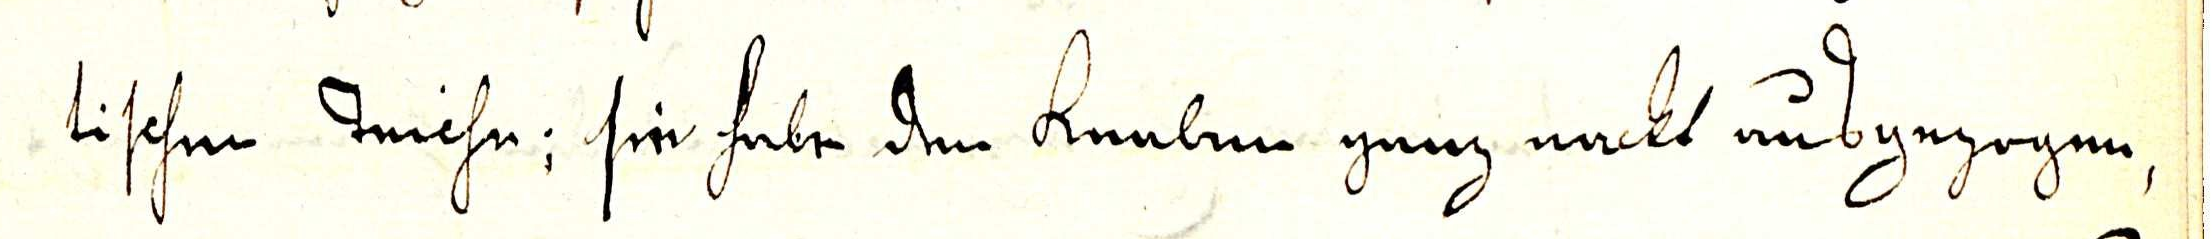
tischen Teiche; sie habe den Knaben ganz nackt ausgezogen,
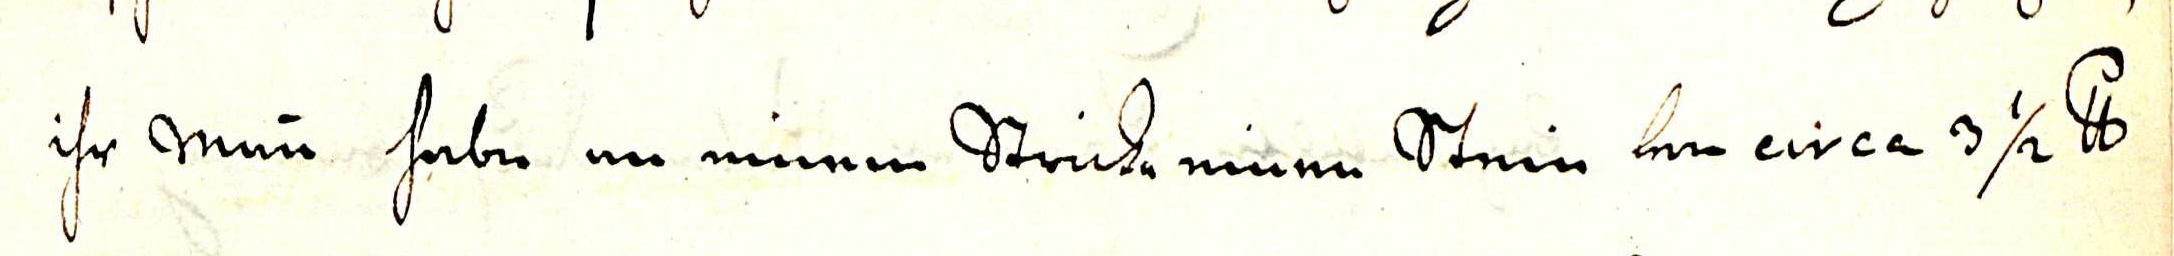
ihr Mann habe an einem Stricke einen Stein von circa 3 ½ lb
